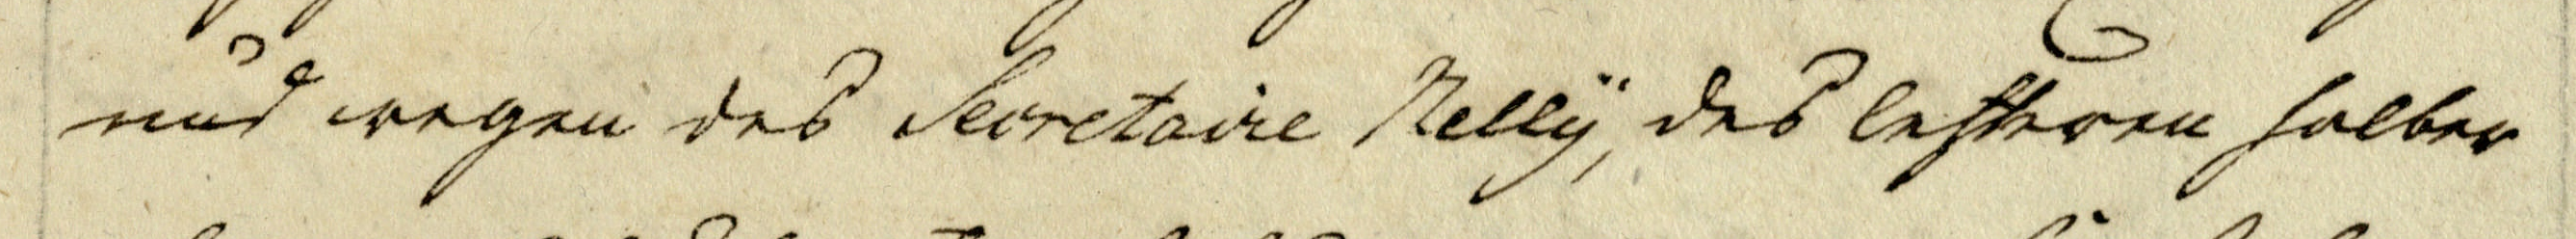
und wegen des Secretaire Nelleÿ, des letzteren halber
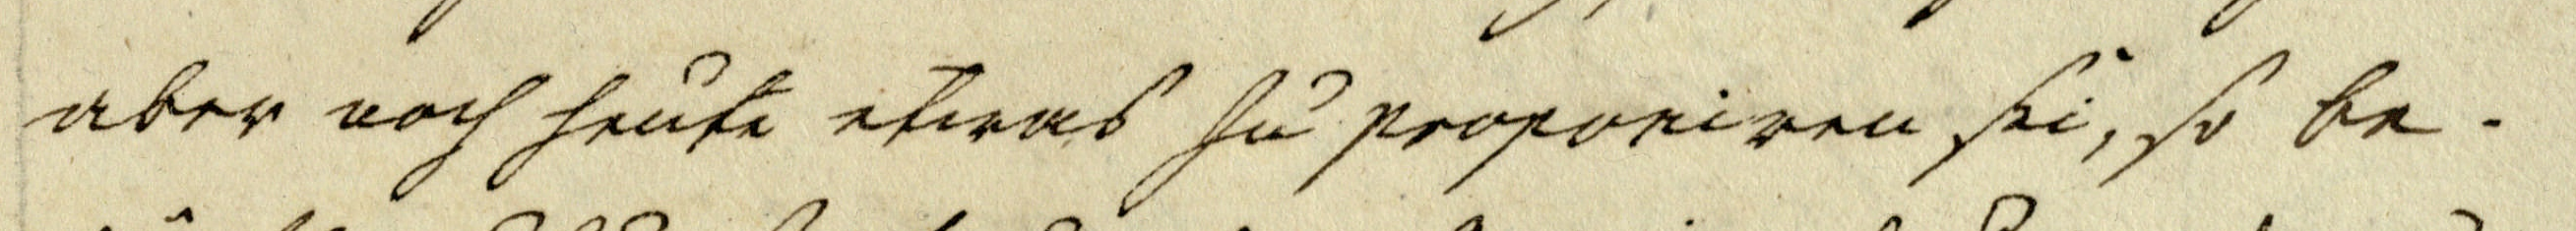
aber noch heute etwas zu proponiren sei, so be¬
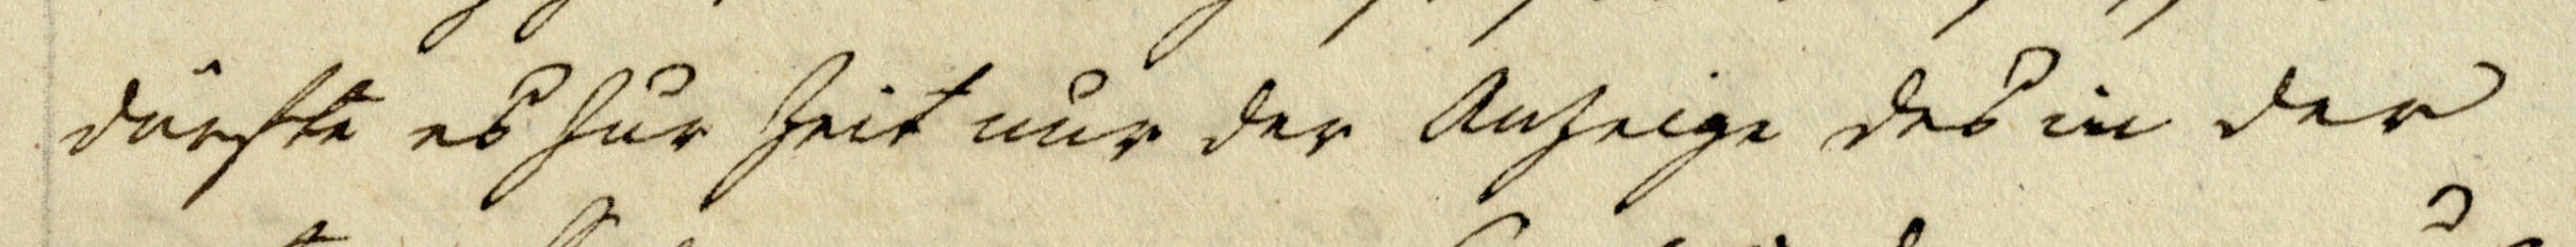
dürfte es zur Zeit nur der Anzeige des in der
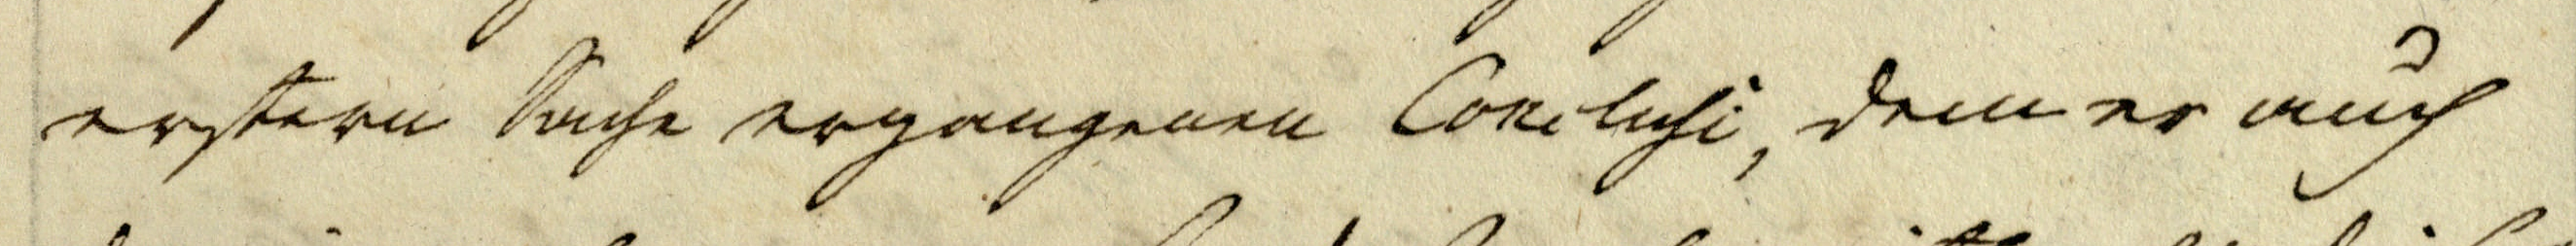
erstern Sache ergangenen Conclusi, dem er auch
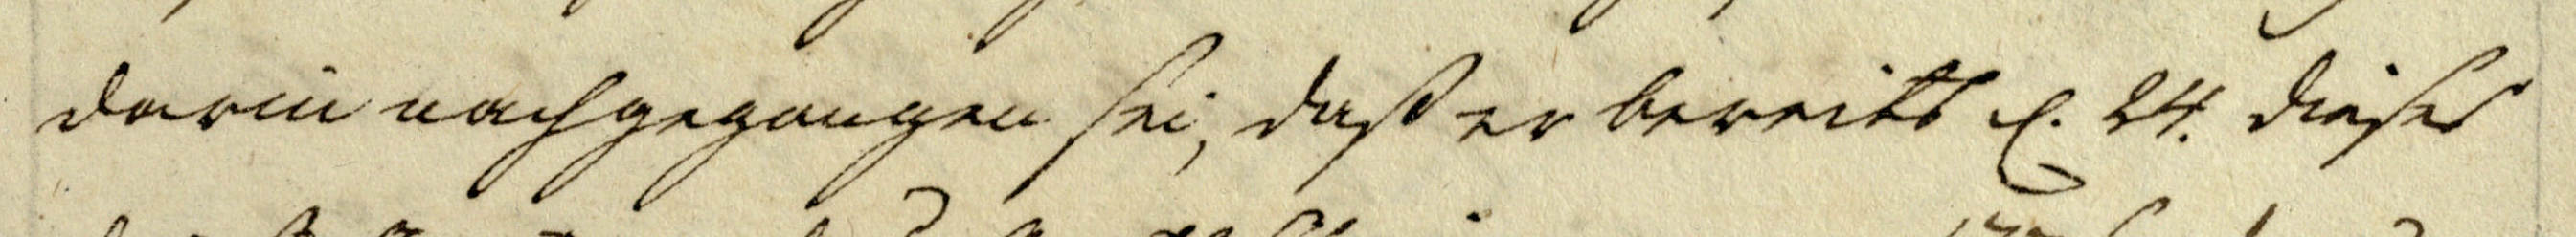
darin nachgegangen sei, daß er bereits d. 24. dieses
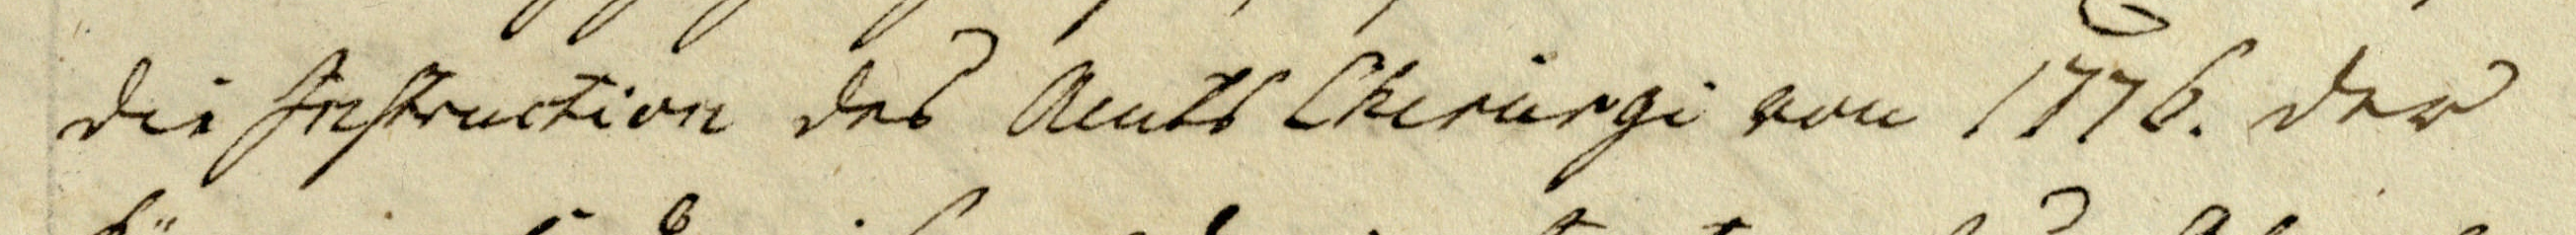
die Instruction des Amts Chirurgi von 1776. der
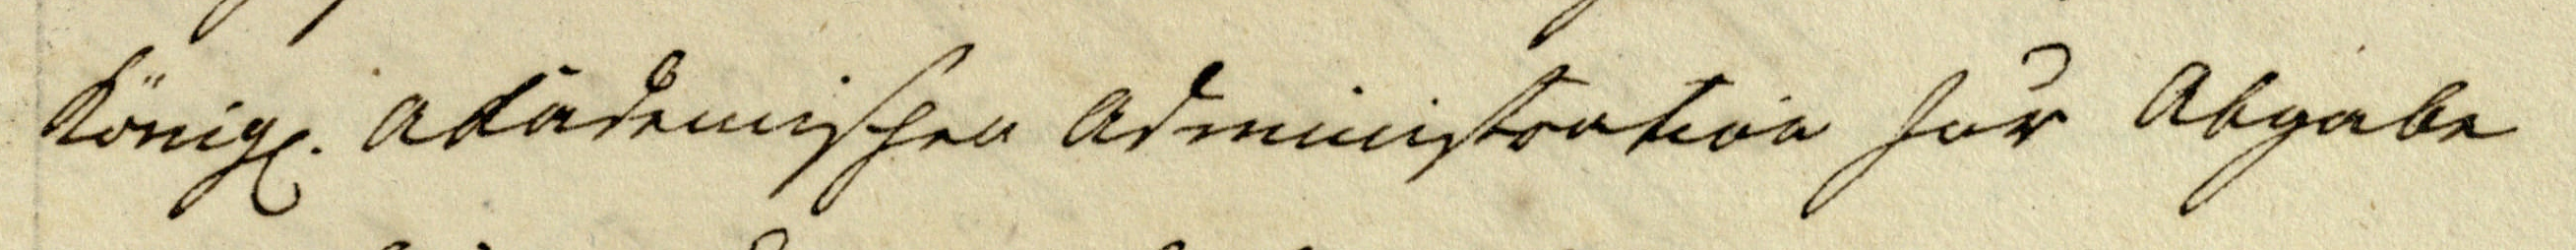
Königl. Akademischen Administration zur Abgabe
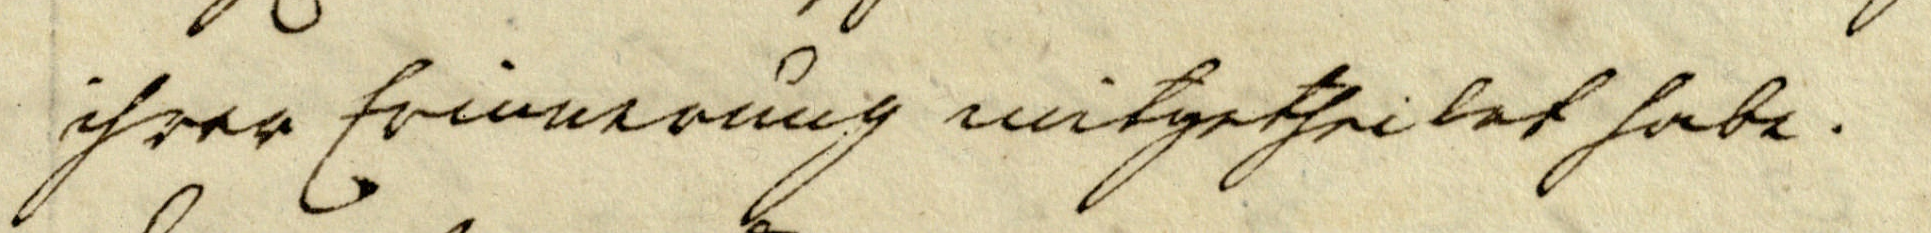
ihrer Erinnerung mitgetheilet habe.
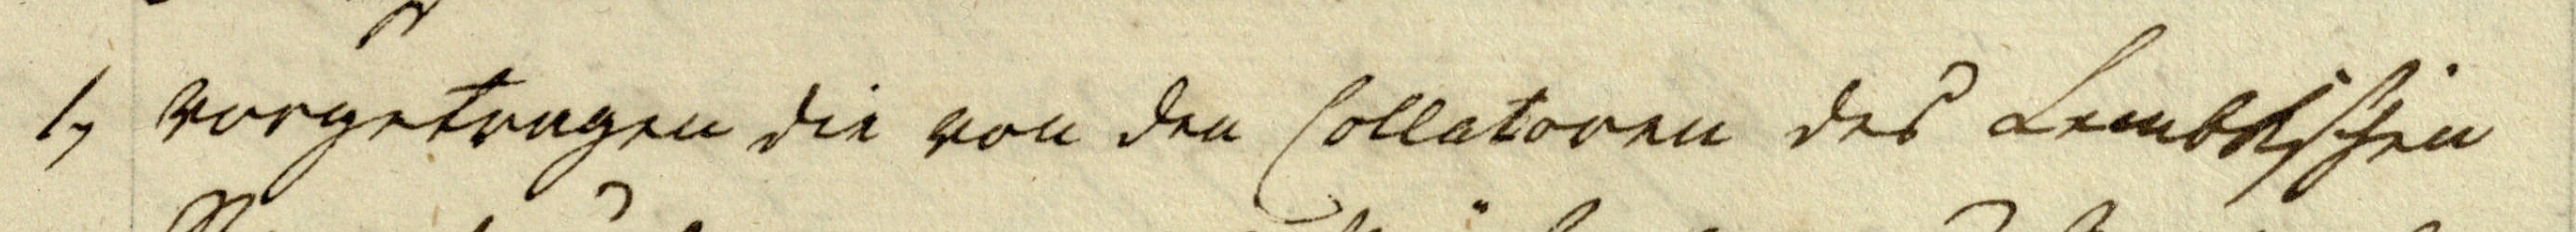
1., vorgetragen die von den Collatoren des Lembkschen
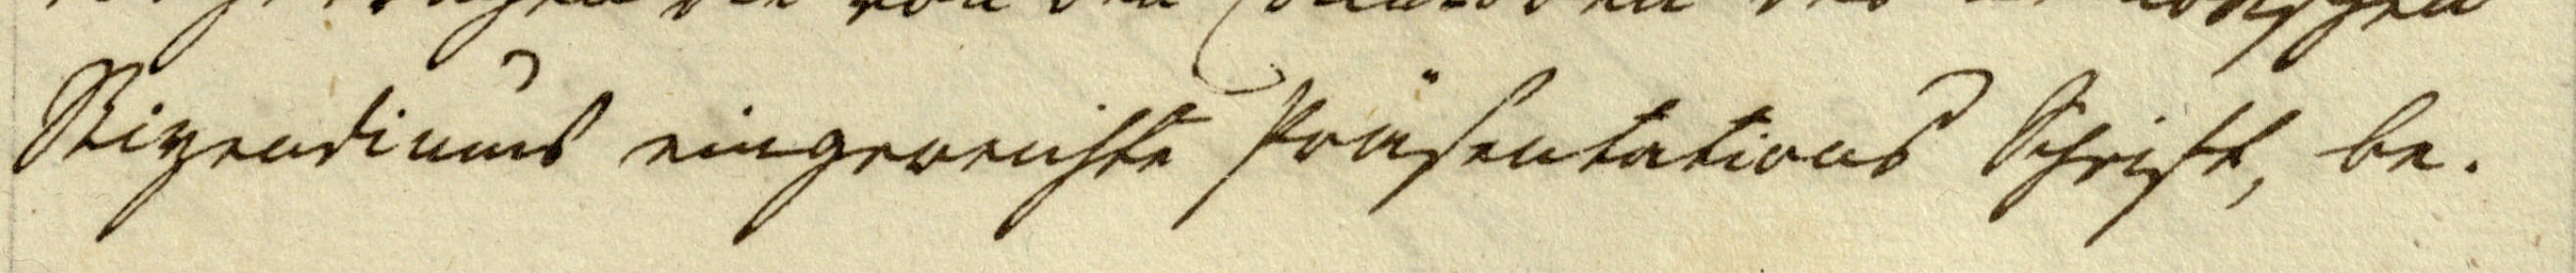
Stipendiums eingereichte Präsentations Schrift, be¬
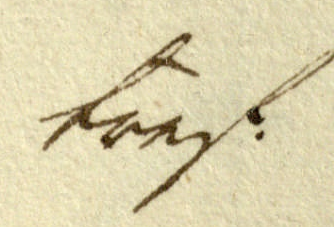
tref¬
